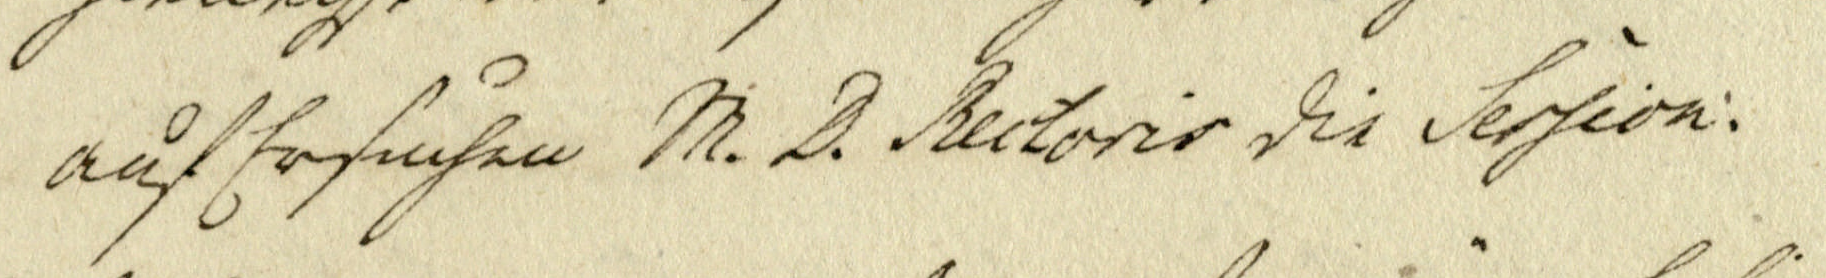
auf Ersuchen M. D. Rectoris die Session.
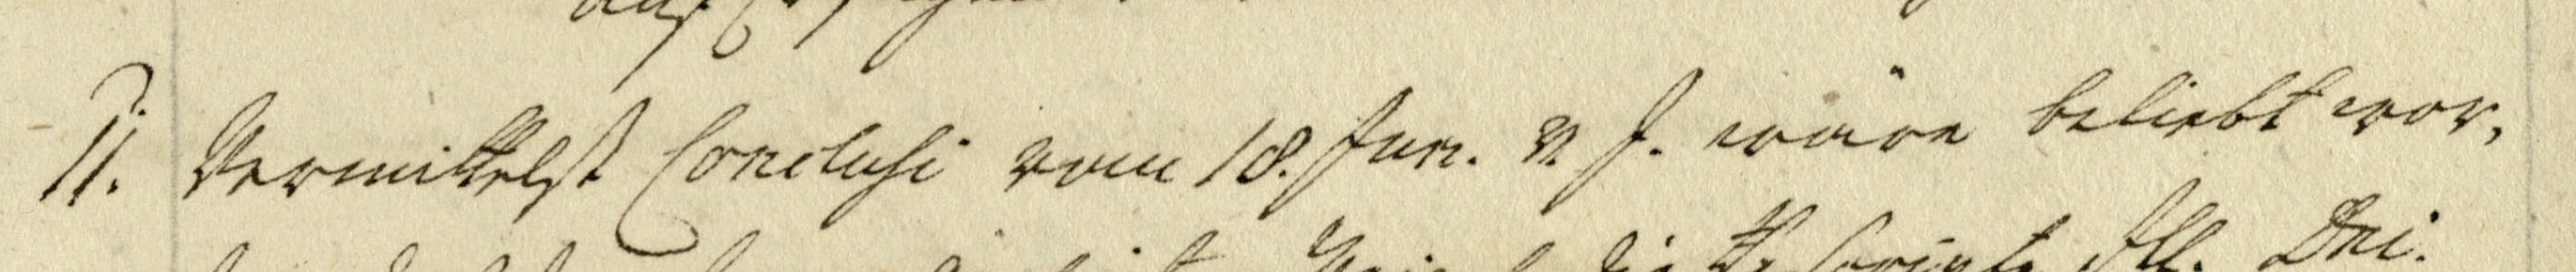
11. Vermittelst Conclusi vom 18. Jun. v. J. wäre beliebt wor¬
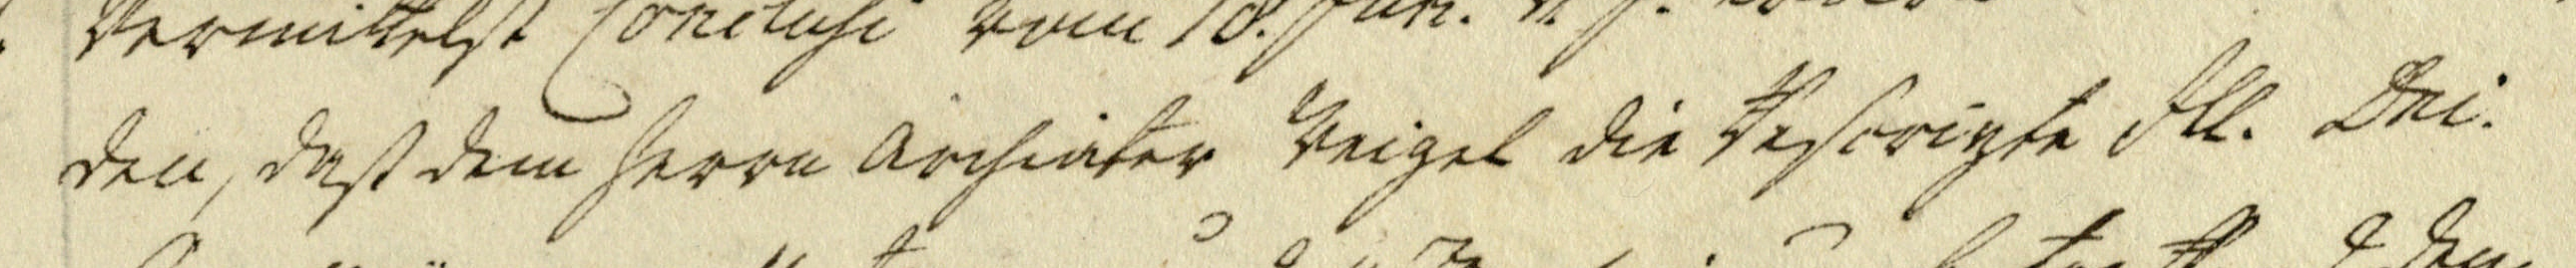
den, daß dem Herrn Archiater Weigel die Rescripte Ill. Dni.
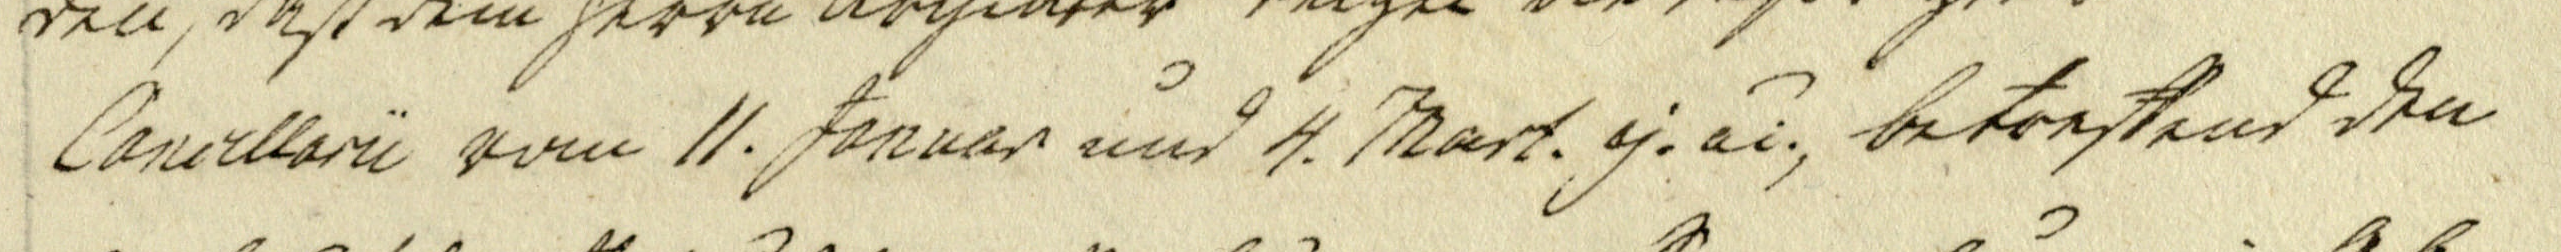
Cancellarii vom 11. Januar und 4. Mart. ej ai, betreffend den
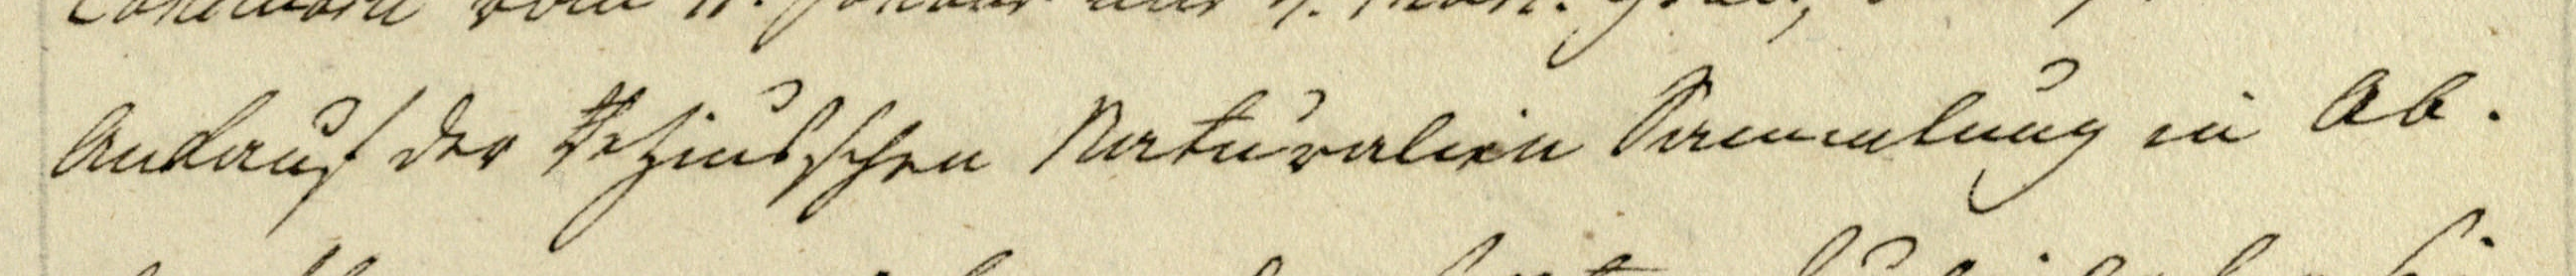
Ankauf der Reziusschen Naturalien Sammlung in Ab¬
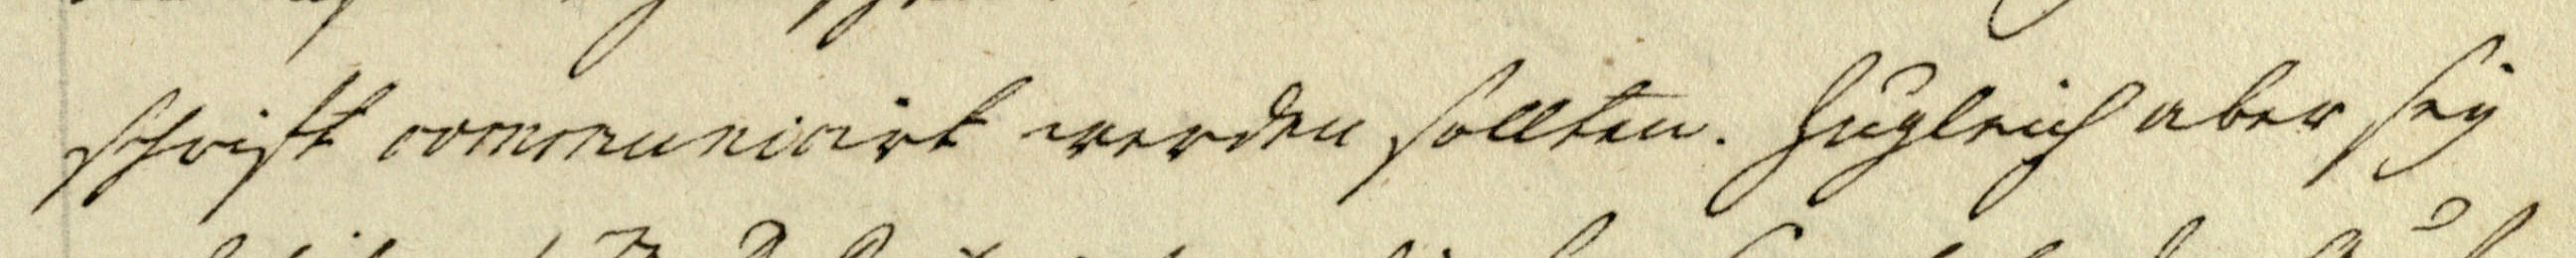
schrift communicirt werden sollten. Zugleich aber seÿ
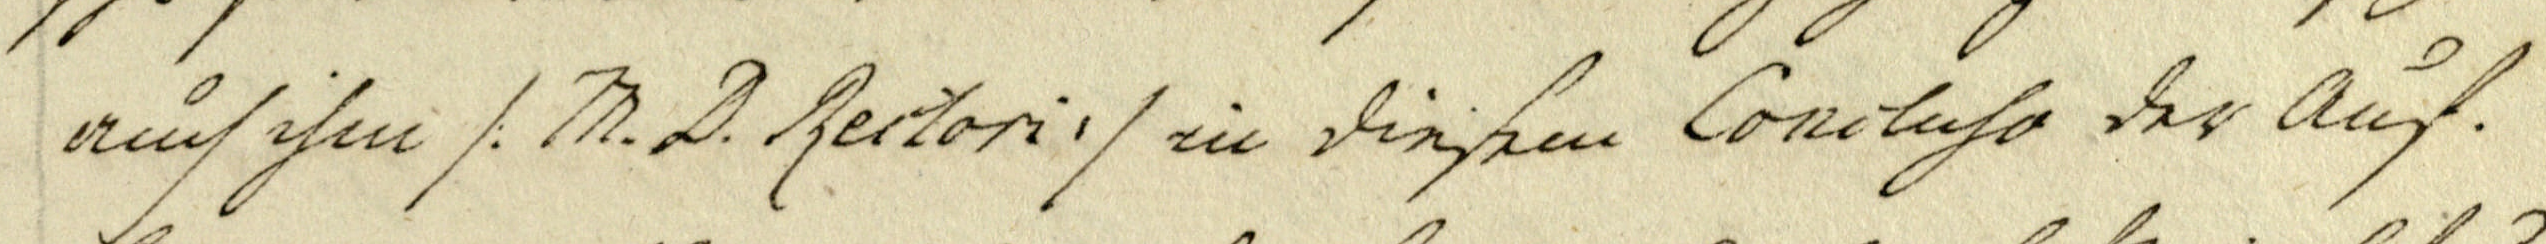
auch ihm /. M. D. Rectori. / in diesem Concluso der Auf¬
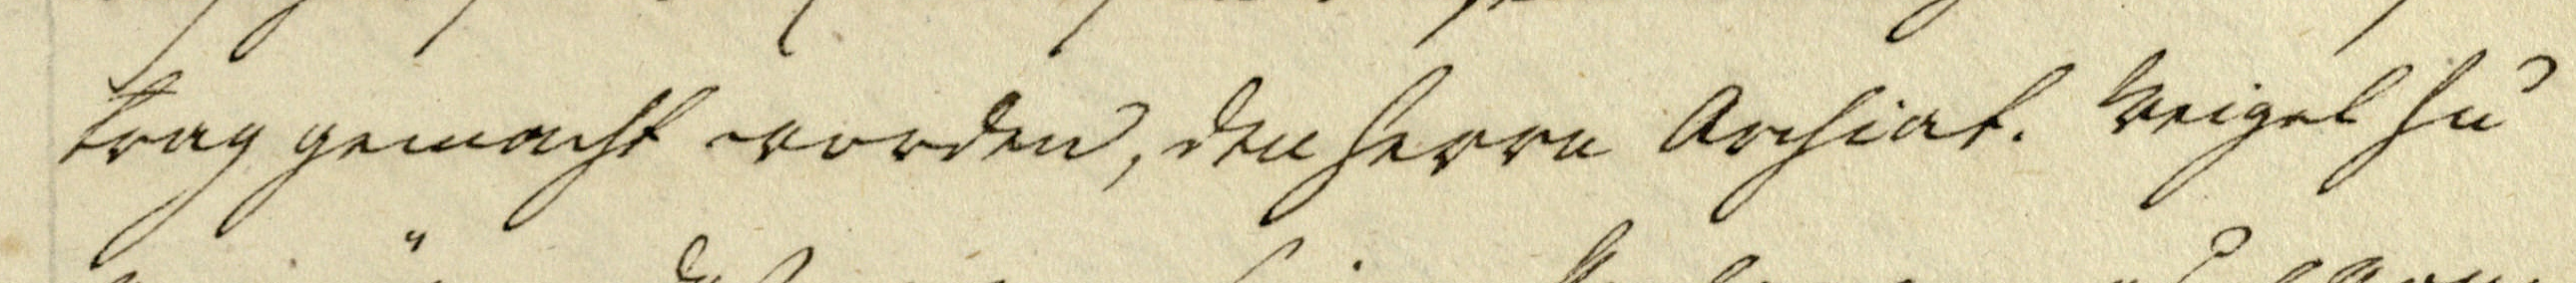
trag gemacht worden, den Herrn Archiat. Weigel zu
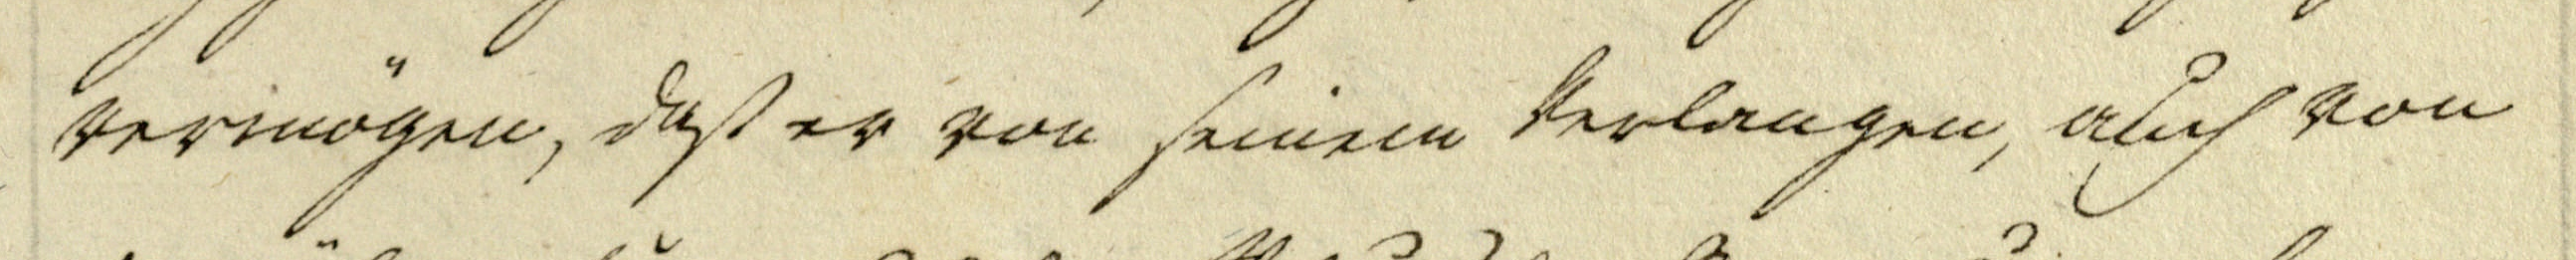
vermögen, daß er von seinem Verlangen, auch von
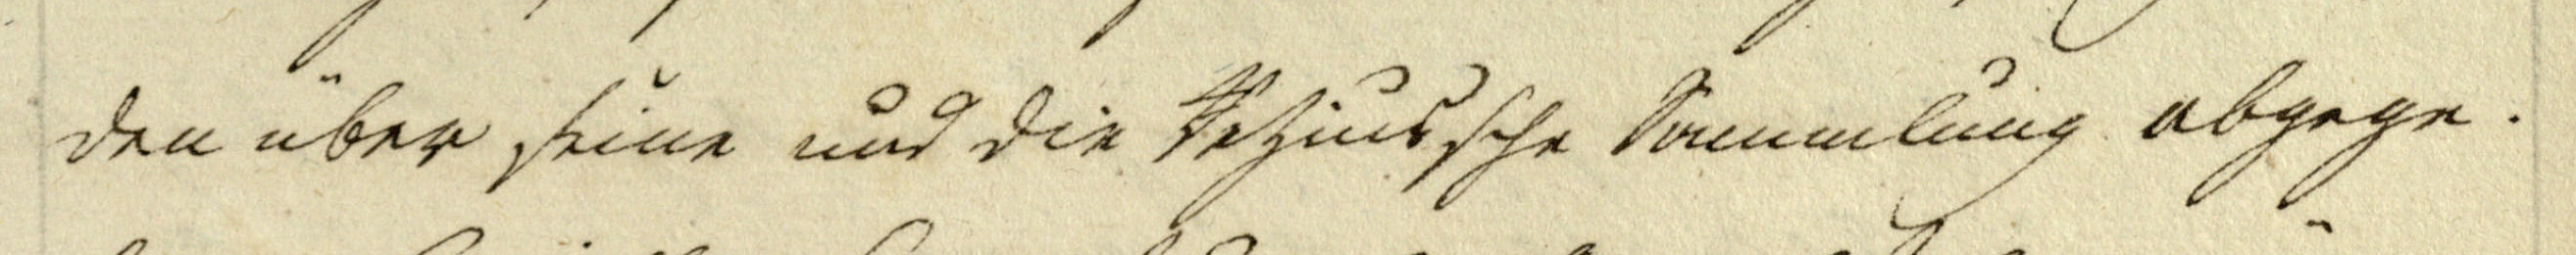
den über seine und die Reziussche Sammlung abgege¬
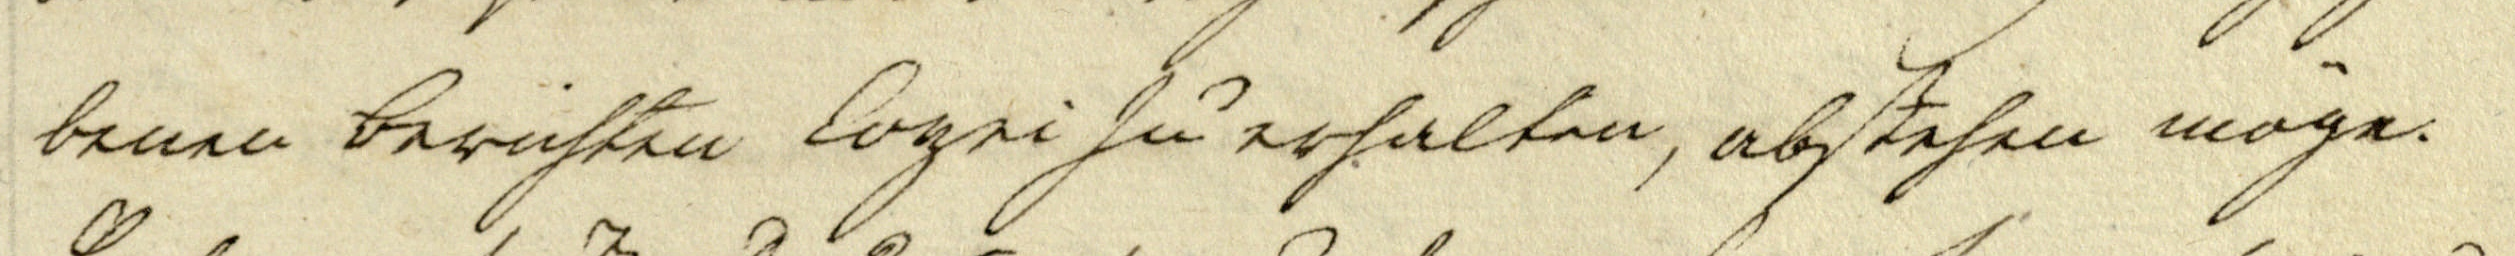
benen Berichten Copei zu erhalten, abstehen möge.
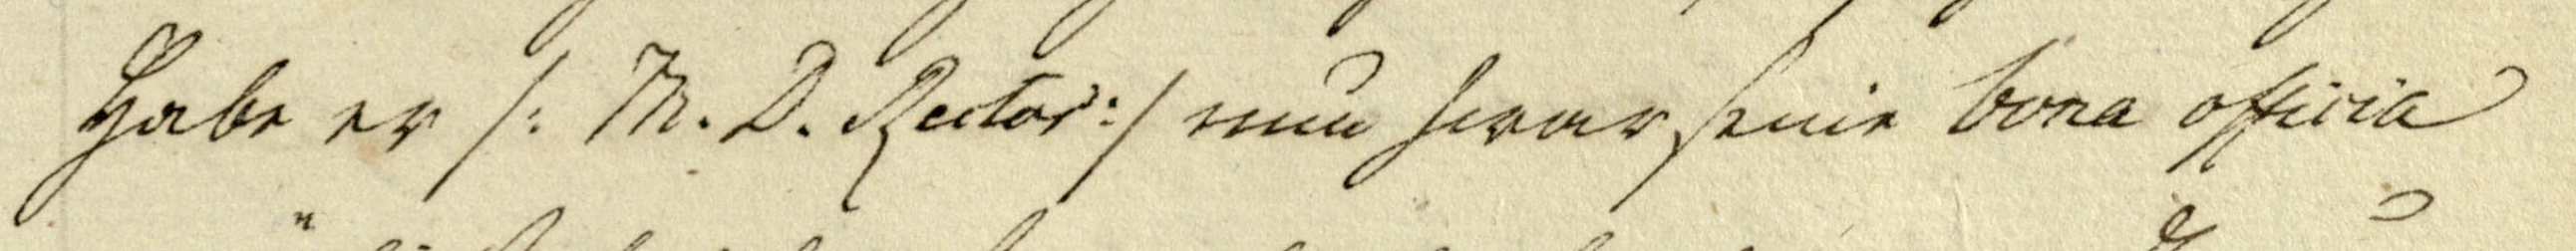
Habe er /. M. D. Rector :/ nun zwar seine bona officia
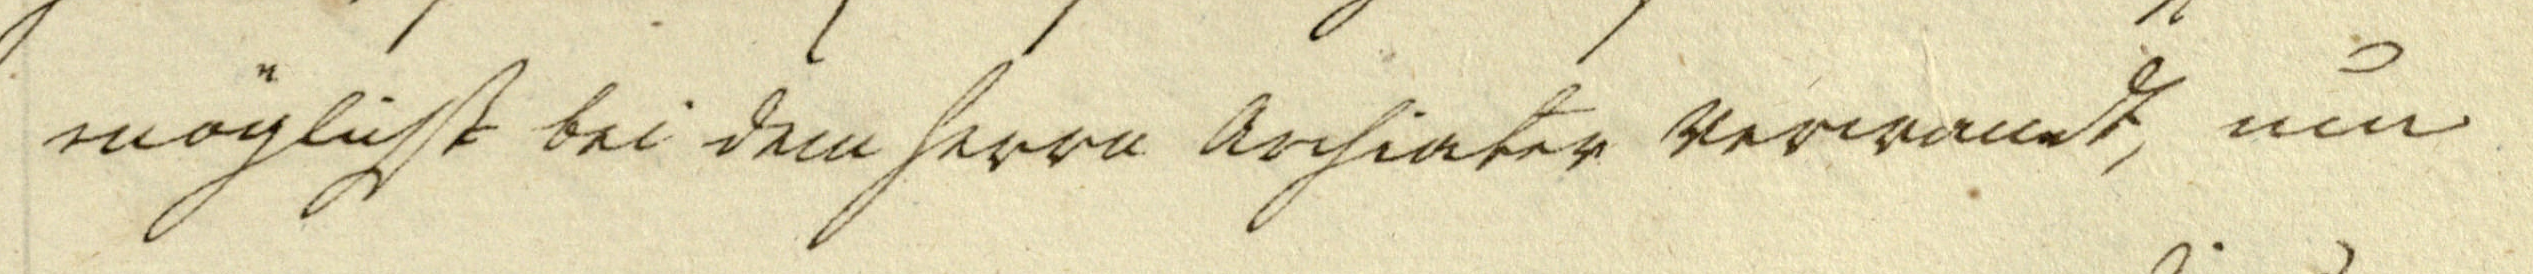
möglichst bei dem Herrn Archiater verwandt, um
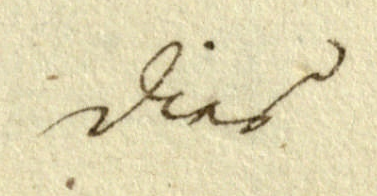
dies
